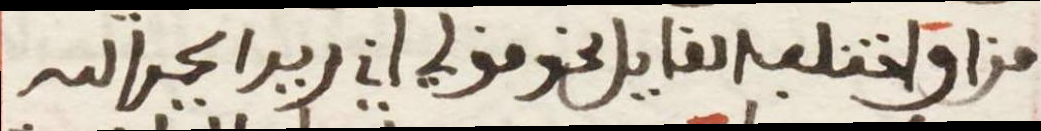من او اختلفه لقايل نحو قولي اني و يد الجبر الله
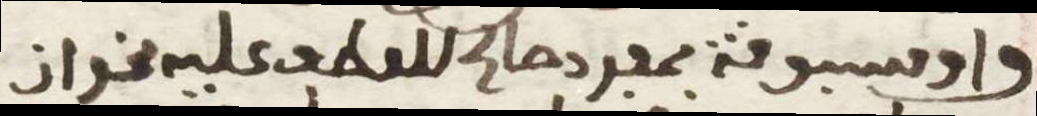واو مسبوقة بمفرد صالح للعطف عليه نحو ان
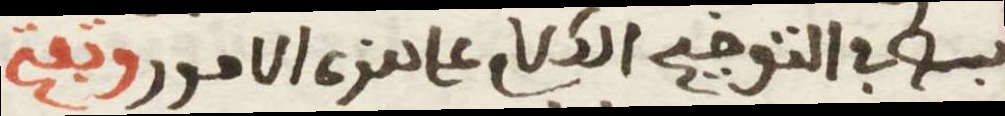بسط في التوضيح الكلام على هذه الامور وتفتح
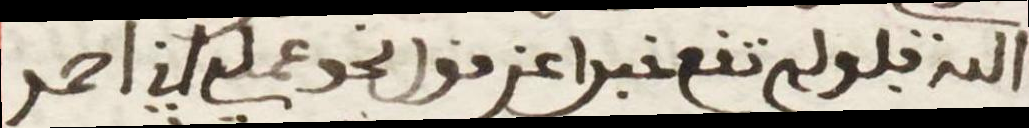الله فلولم تقع خبرا عن قول نحو عملي اني احمد
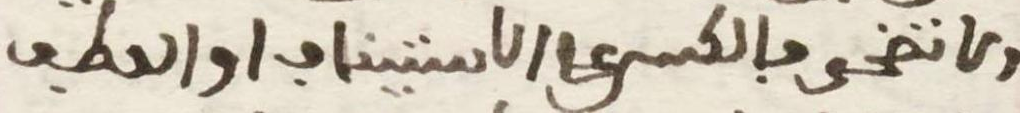ولاتضحى فالكسر على الاستيناف او العطف
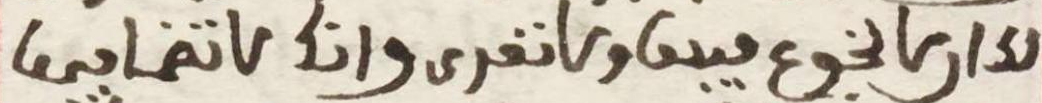لك ان لاتجوع فيها ولاتعرى وانك لا تظما فيها
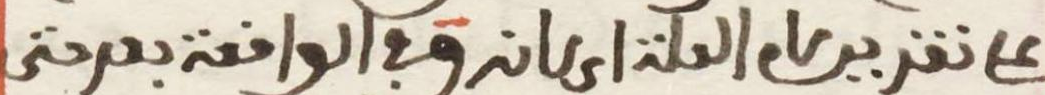على تقرير لام العلة أي لانه وفي الواقعة بعد حتى
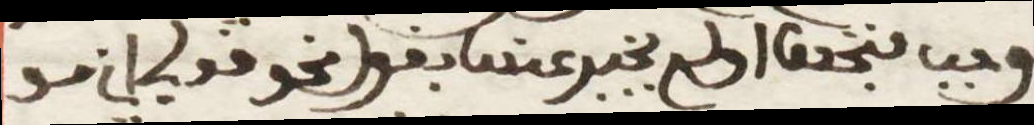وجب فتحها اولم لم يخبر عنها بقول نحواني مو
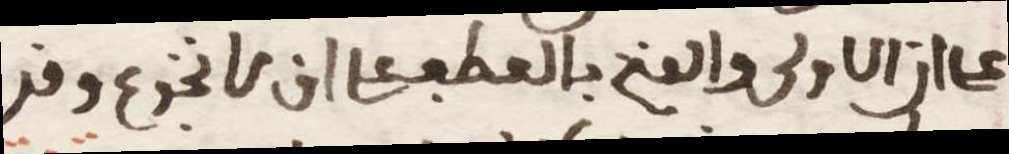على ان الأولى والفتح بالعطف على ان لاتجوع وقر
